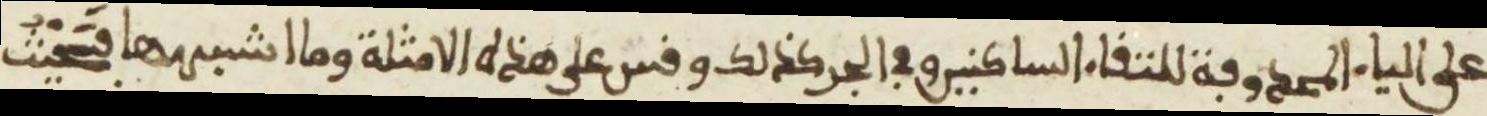على الياء المحذوفة للتقاء الساكنين و في الجر كذلك و قس على هذه الامثلة و ما اشبهها فحيث
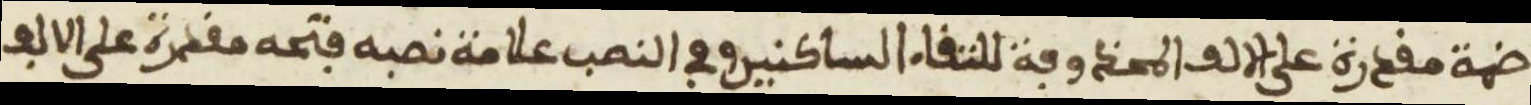ضمة مقدرة على الالف المحذوفة للتقاء الساكنين و في النصب علامة نصبه فتحة مقدرة على الالف
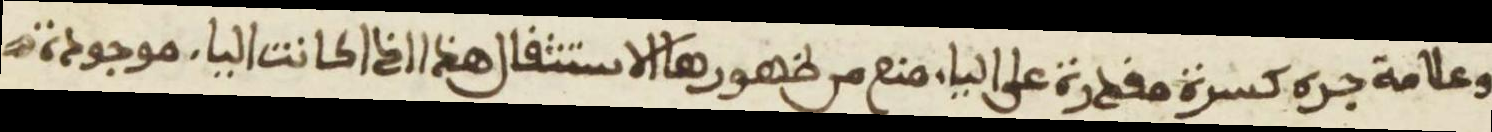و علامة جره كسرة مقدرة على الياء منع من ظهورها الاستثقال هذا اذا كانت الياء موجودة
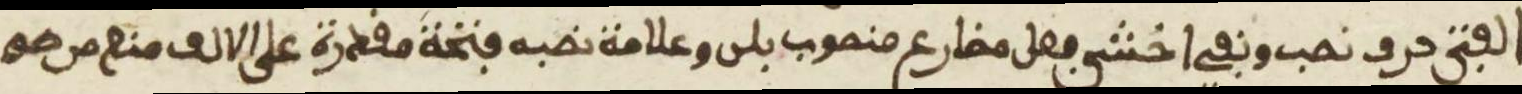الفتى حرف نصب و نفي اخشى فعل مضارع منصوب بلى و علامة نصبه فتحة مقدرة على الاف منع من
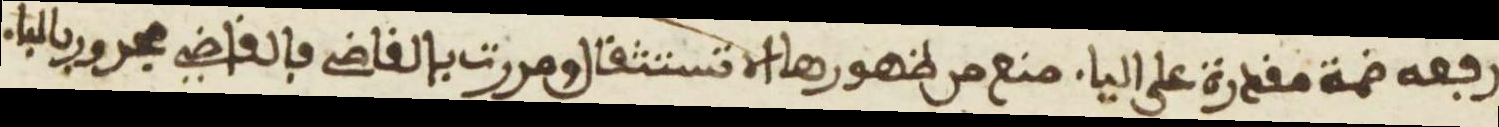رفعه ضمة مقدرة على الياء منع من ظهورها الستثقال و مررت بالقاضي فالقاضي مجرور بالباء
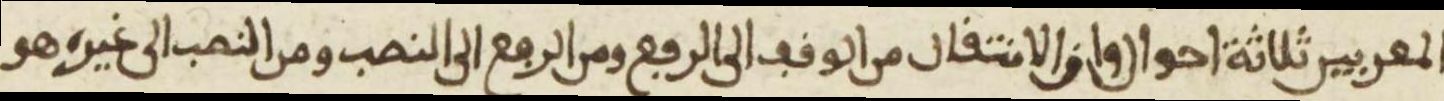المعربين ثبلثة احوال و ان الانتقال من الوقف الى الرفع و من الرفع الى النصب و من النصب الى غيره هو
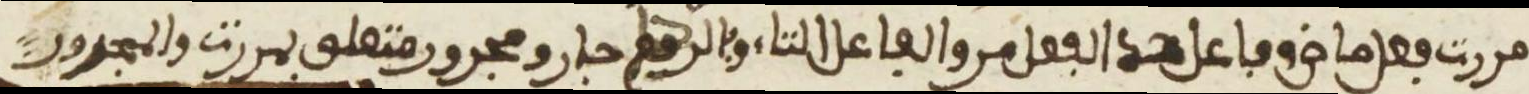مررت فعل ماض و فاعل حد الفعل مر و الفاعل التاء و بالرحا جار و مجرور متعلق بمررت و المجرور
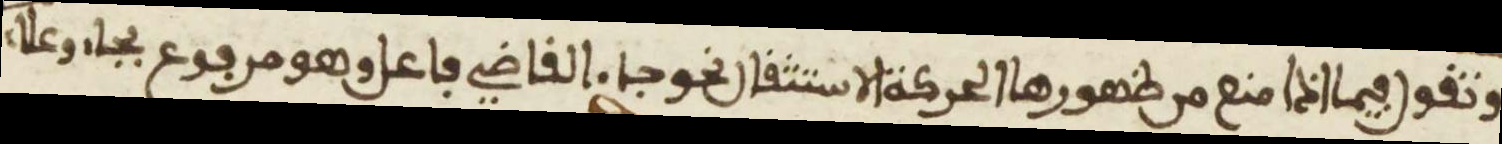و تقول فيما اذا منع من ظهورها الحركة الاستثقال نحو جاء القاضي فاعل و هو مرفوع بجاء و علا
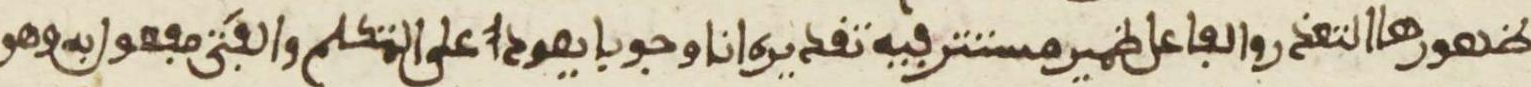ظهورها التعذر و الفاعل ظمير مستتر فيه تقديره انا وجوبا يعود على المتكلم و الفتى مفعول به و هو
